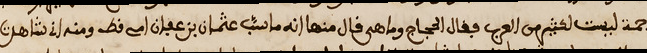جمة ليست لكثير من العرب فقال الحجاج وما هى قال منها انه ما سب عثمان بن عفان امى قط ومنه انى شاهدت
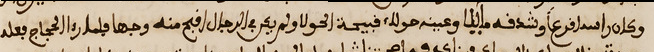وكان راسه اقرع و شدقه مايلا وعينه حولاء قبيحة الحولا ولم يكن في الرجال اقبح منه وجها فلما رءا الحجاج فعله
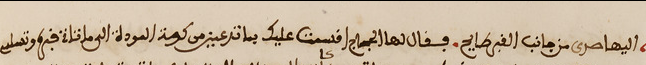اليها صدى من جانب القبر طايح فقال لها الحجاج اقسنت عليك بما تدعين من حرمة المودة الى ما تاتى قبره تسلم
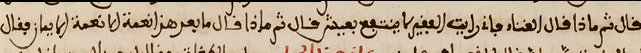قال ثم ماذا قال الغناء فانى رايت الفقير لا ينتفع بعيش قال ثم ماذا قال ما بعد هذا نعمة لا نعمة الايمان فقال
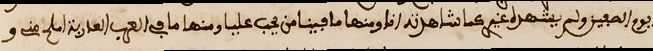يوم الصفين ولم يشهده غيرى كما شاهدته انا ومنها ما فينا من يحب عليا ومنها ما فى العرب العاربة املح منه و
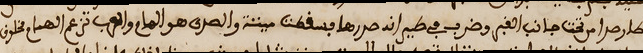طار صدا من تحت جانب القبر وضرب فى طيرانه صبرها فسقطت ميتة والصدى هو الهام والعرب تزعم الهمام مخلوق
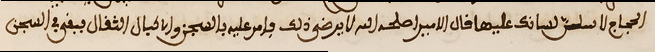الحجاج لا سلس لسانك عليها قال الامير اصلحه الله لا يرضى ذلم فامر عليه بالسجن والاكبال الثقال ببقى في السجن
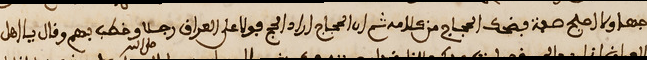جها ولا اصبح صفة فضحك الحجاج من كلامه ثم ان الحجاج فو لا على العراق رجلا وخطب بهم وقال يا اهل
